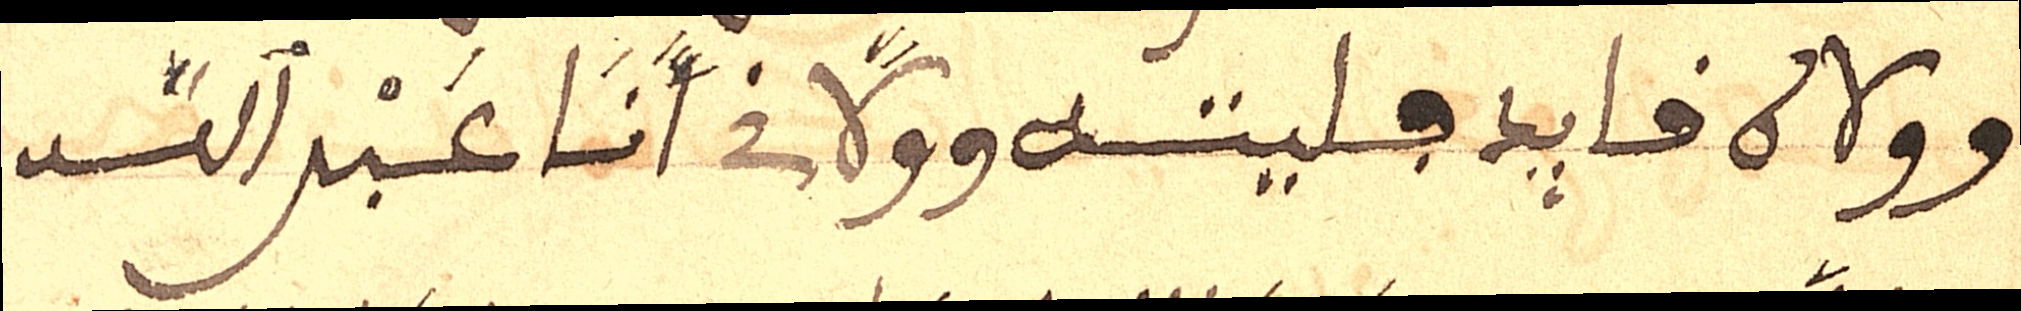وولاه قائد فليته وولانى انا عبد الله
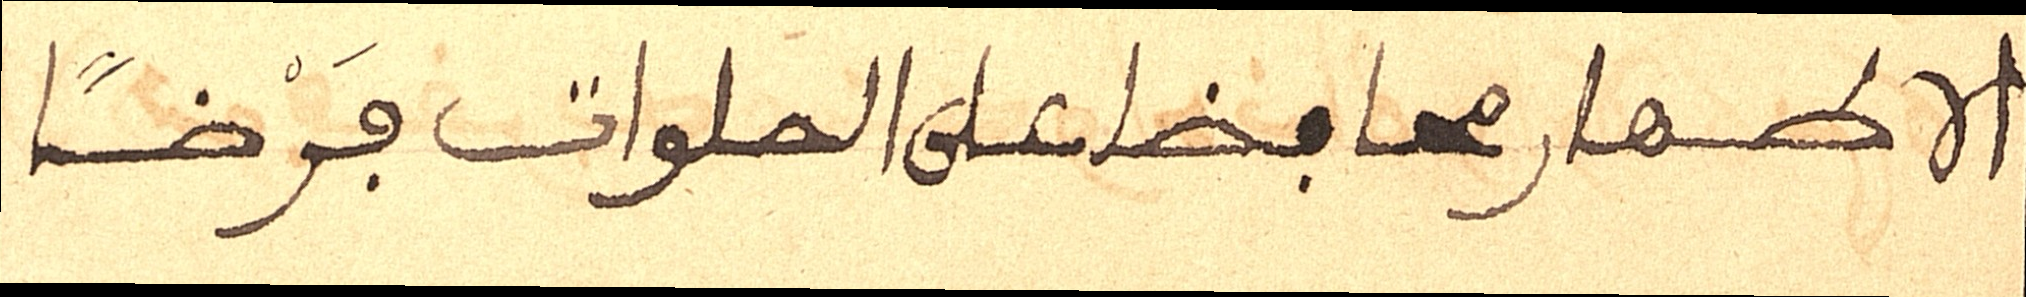الاطهار محافضا على الصلوات فرضا
